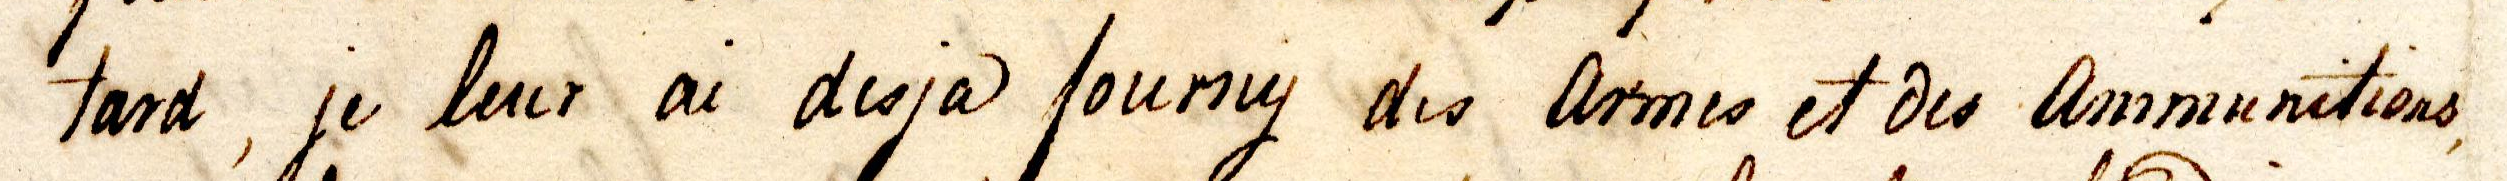tard, je leur ai desja Journey des Armes et des Ammunitions
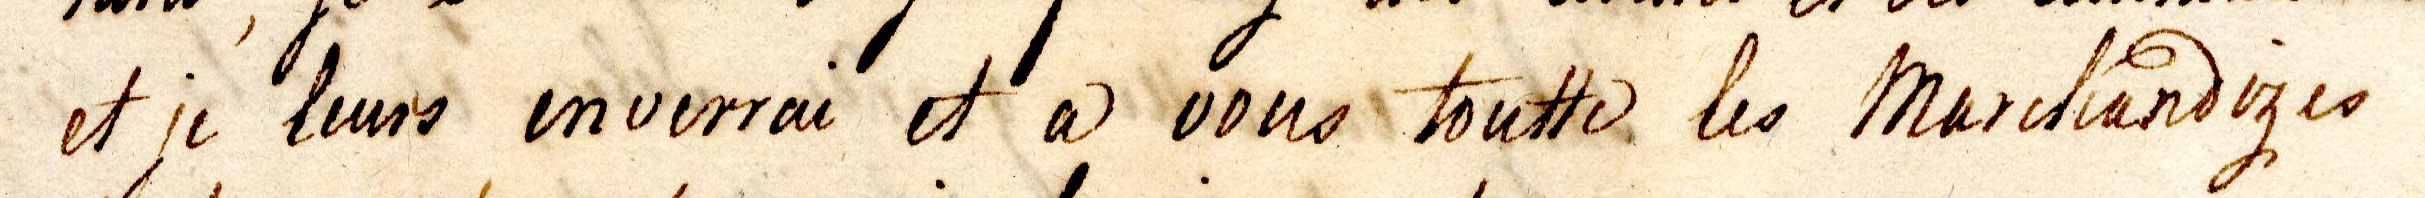et je leurs enverrai et a vous toutte les Marchandizes
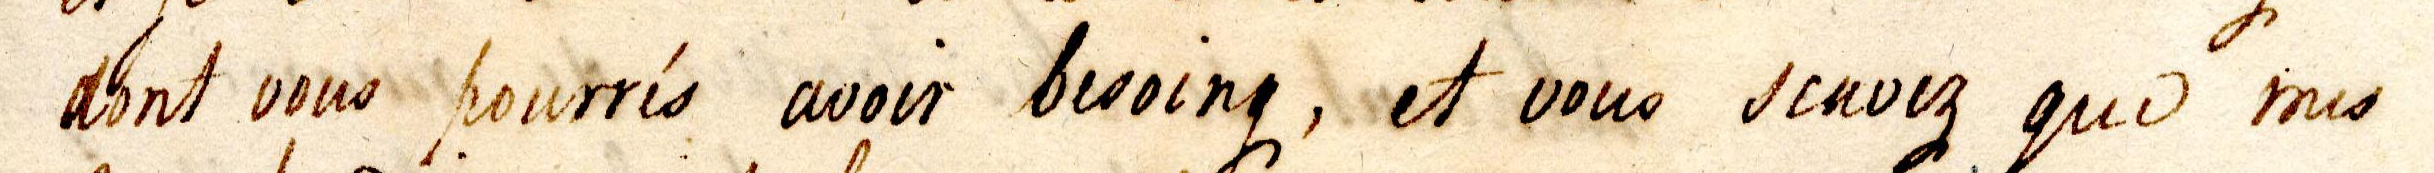dont vous pourrés avoir besoing, et vous senvez qui mes
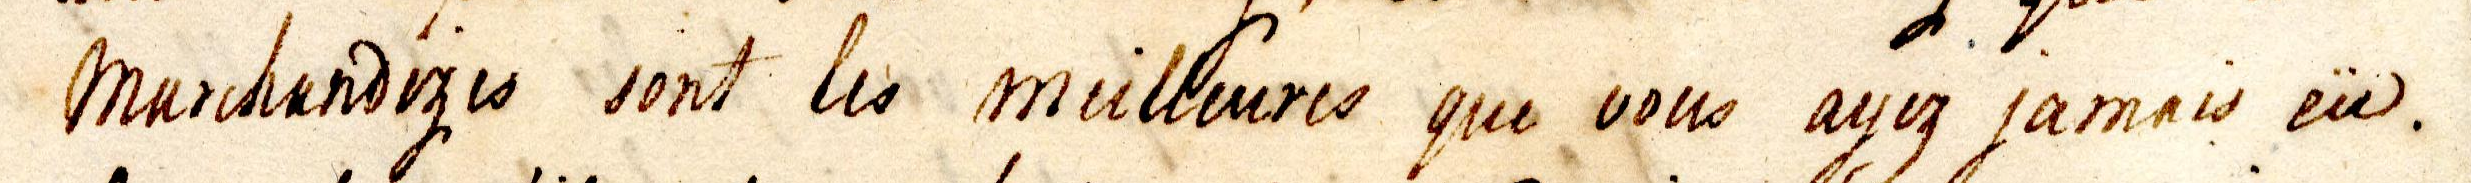Marchandizes sont les meilleures que vous ayez jamais eü.
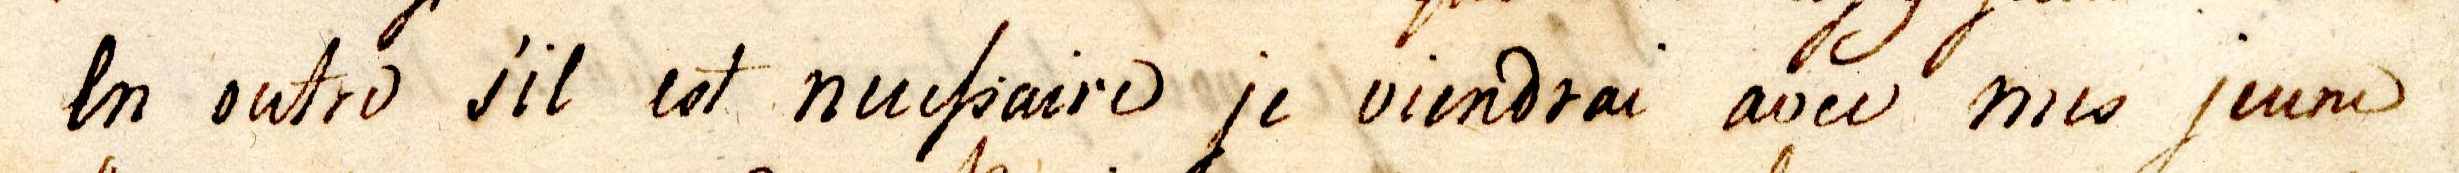En outre s'il est necessaire je viendrai avec mes jeune
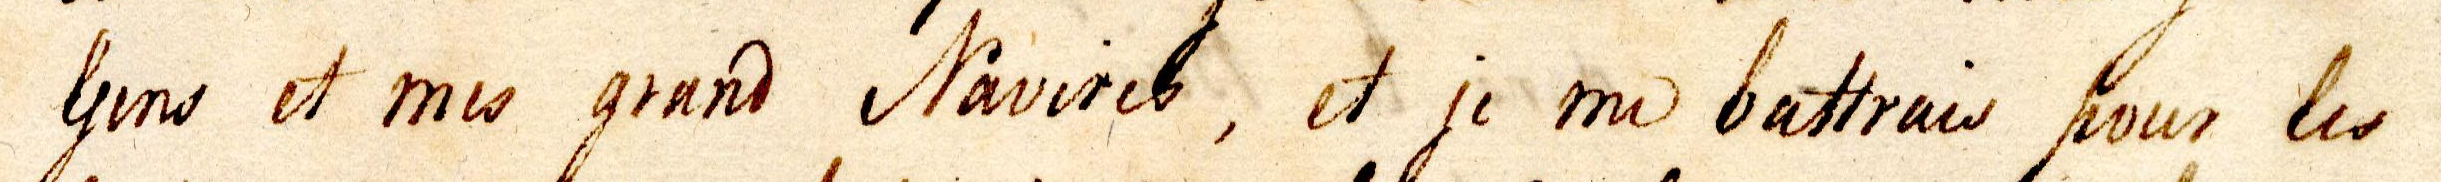Gens et mes grand Navires, et je me battrais pour les
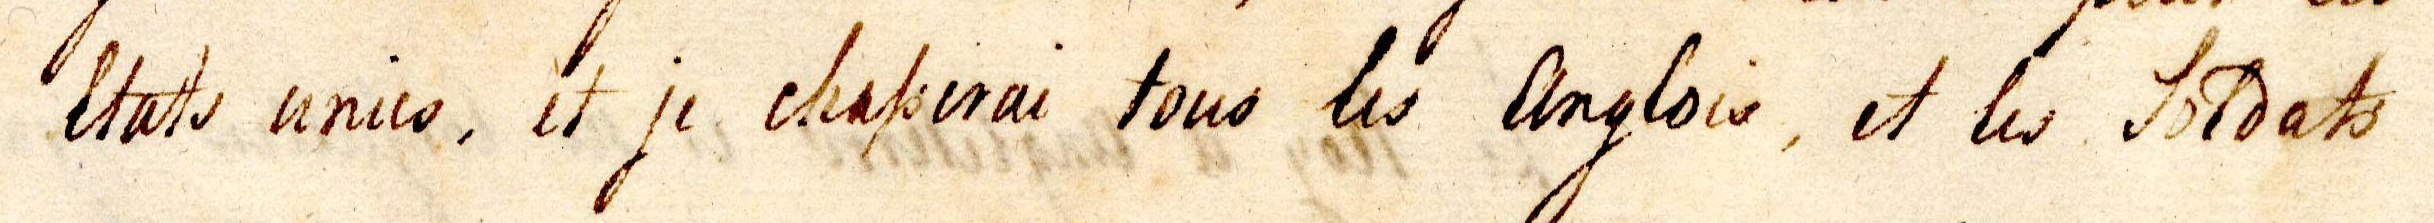Etats unies, et je chaperai tous les Anglois, et les Soldats
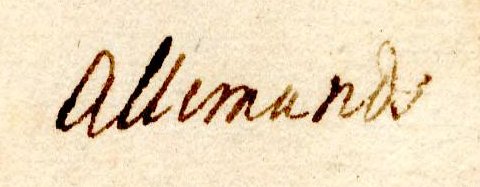Allemands
